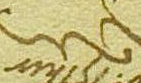together
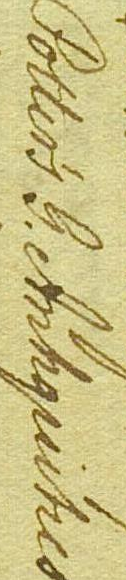Potter's G. Antiquities.
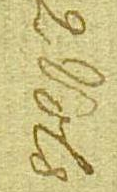2 Vols
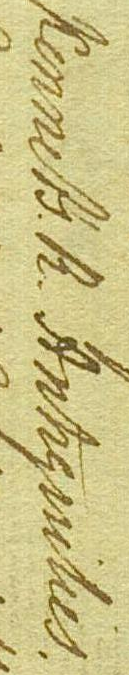Kennet's. R. Antiquities.
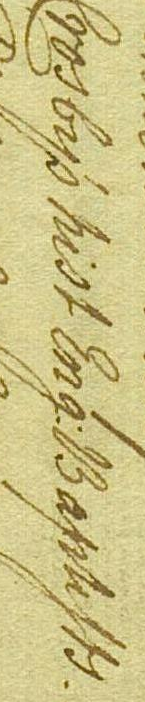Crosby's hist Eng: Baptists.
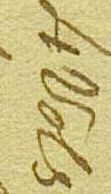4 Vols
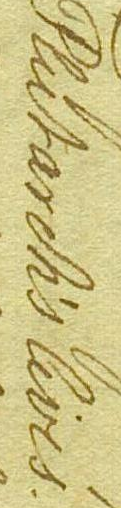Pluctarch's lives.
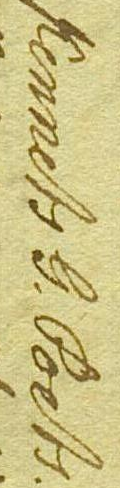Kennets G. Poets.
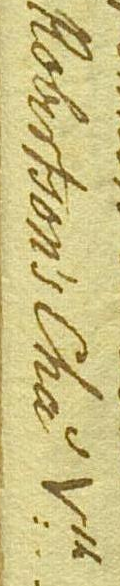Robertson's Cha V^th.
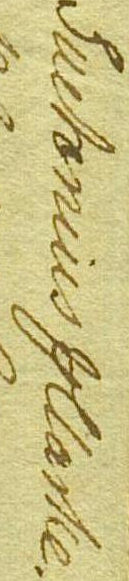Suetonius & Clarke.
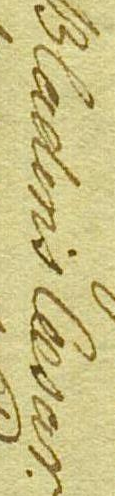Bladen's Cesar.
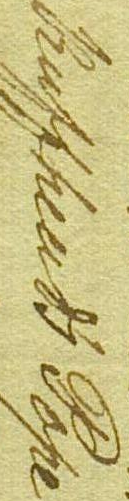Ruffhead's Pope
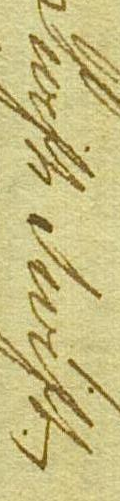Swift Swift
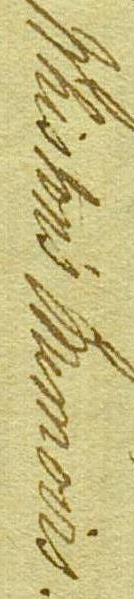Whiston's Memoirs
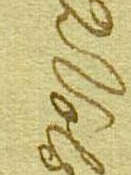2 Vols
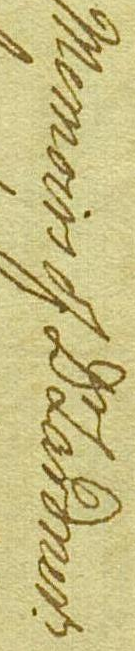Memoirs of D^r Lardner.
